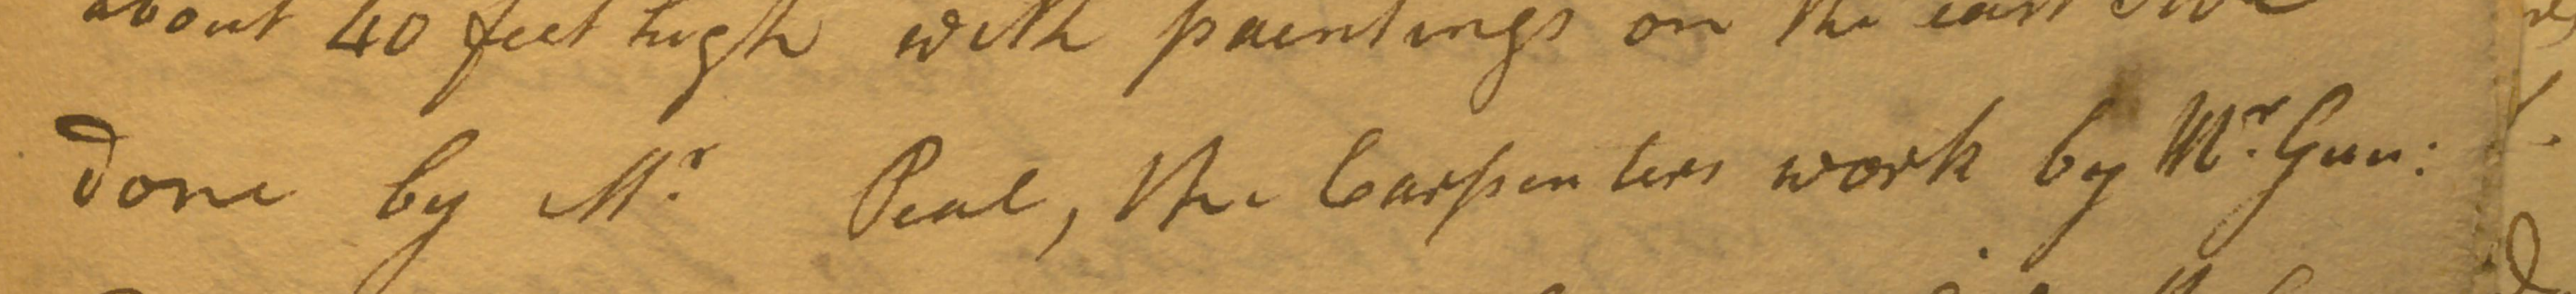done by M^r. Peal, the Carpenters work by M^r. Gun:
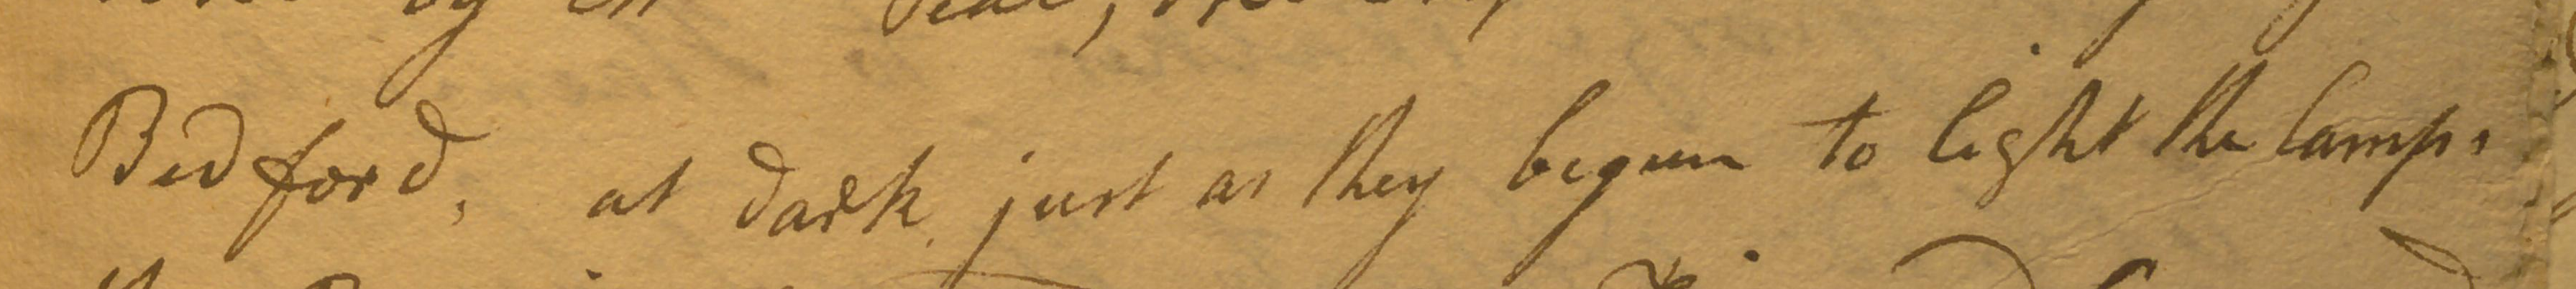Bedford. at dark just as they begun to light the lamps
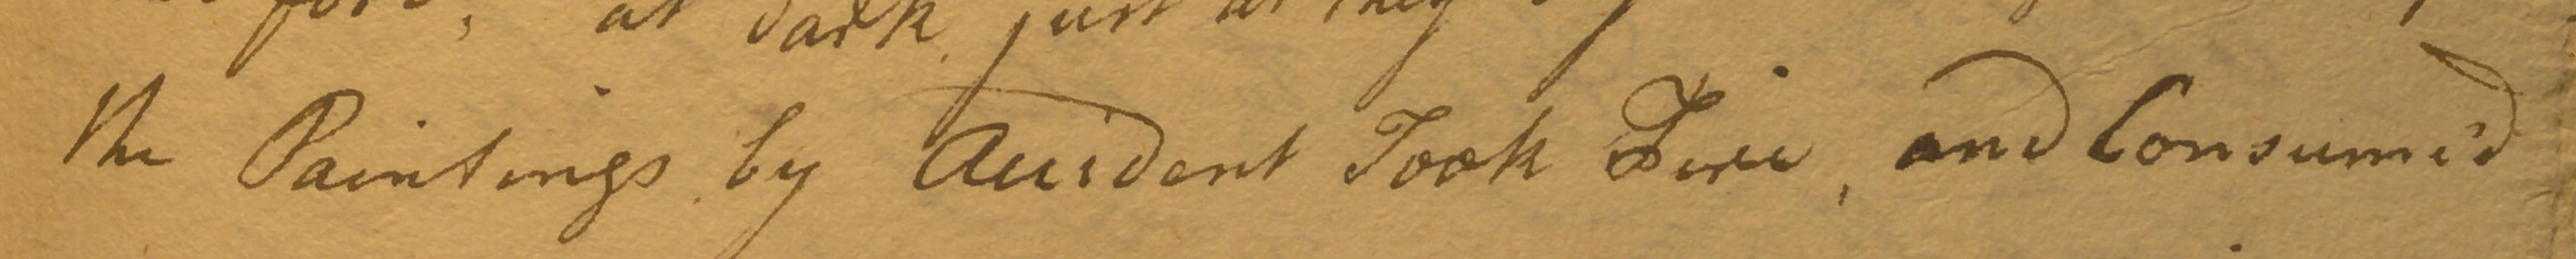the Paintings by Accident Took Fire and Consume'd
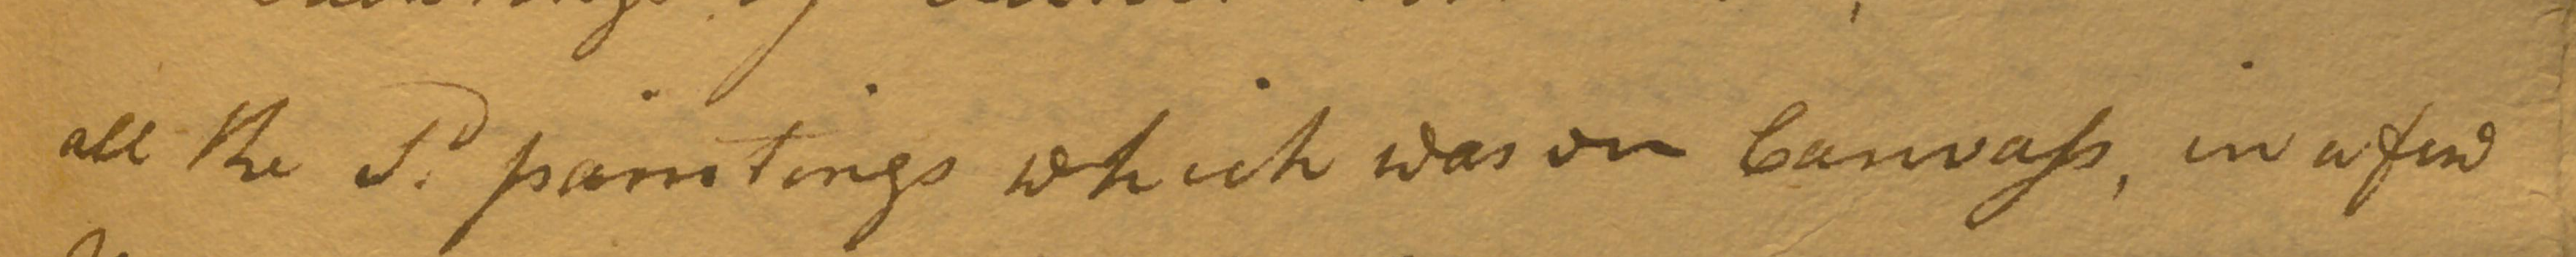all the s^d. paintings which was on Canvass, in a few
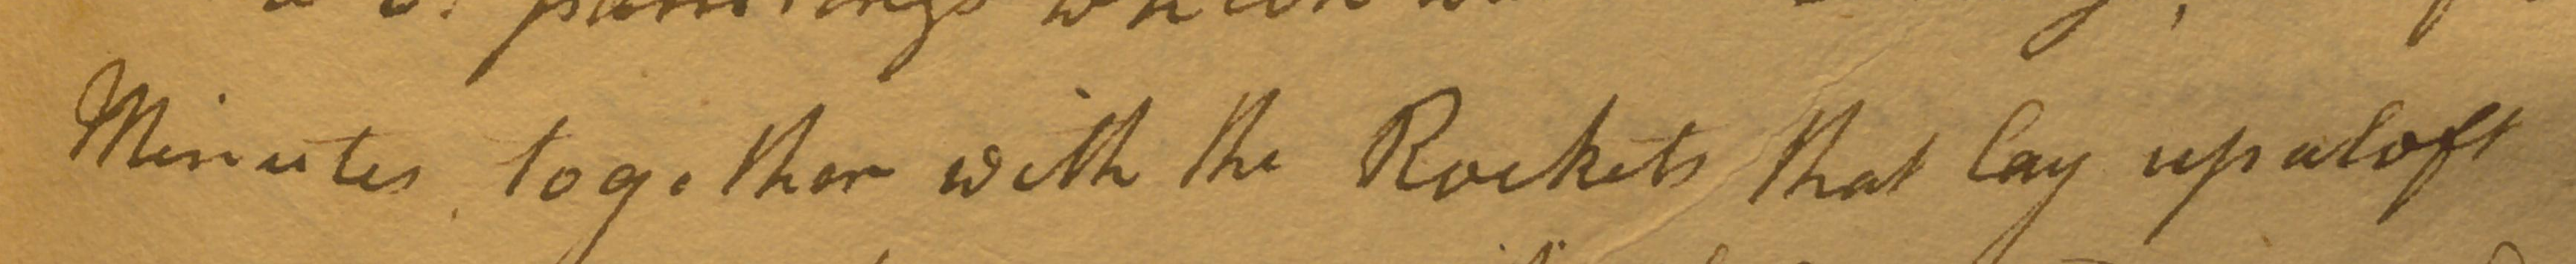Minutes to go then with the Rockets that lay up aloft
